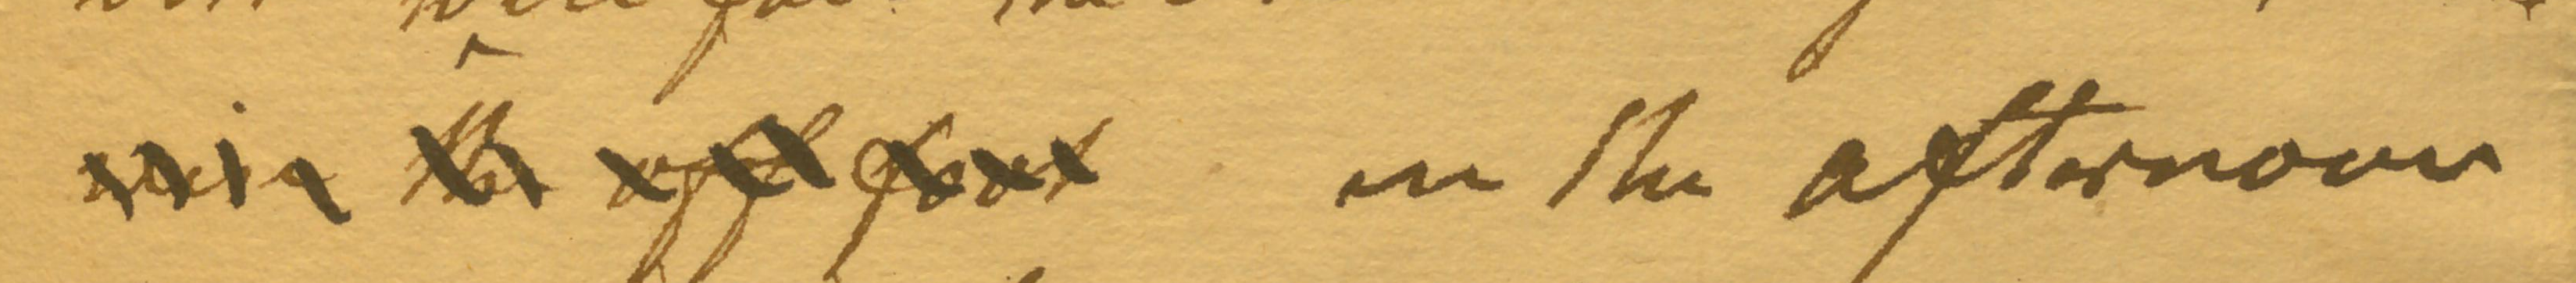[witj the off foot] in the afternoon
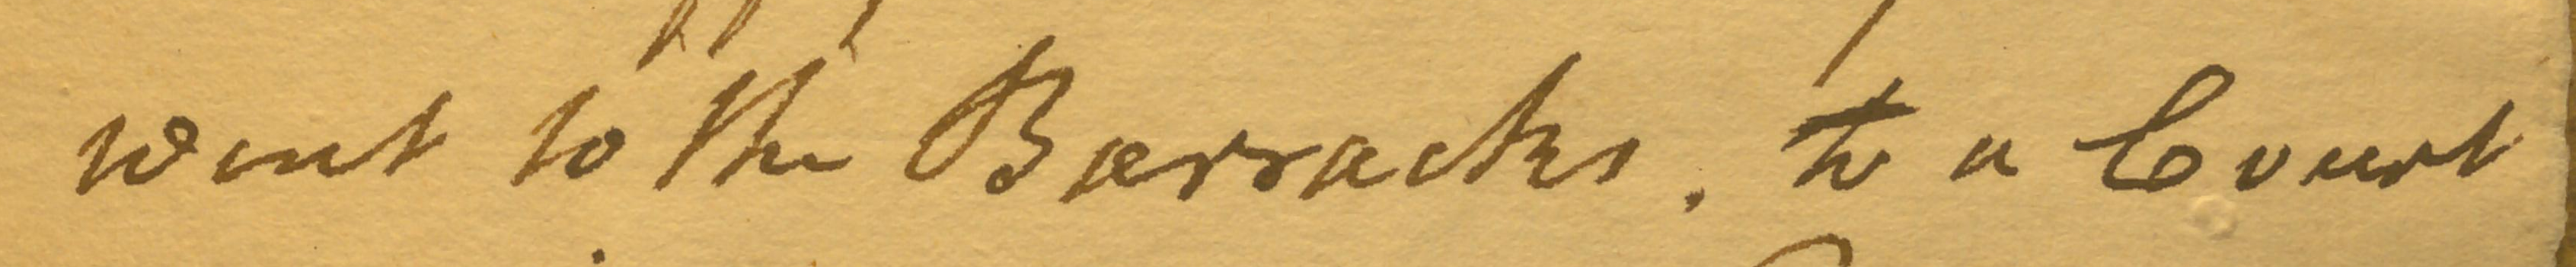went to the Barracks, to a Court
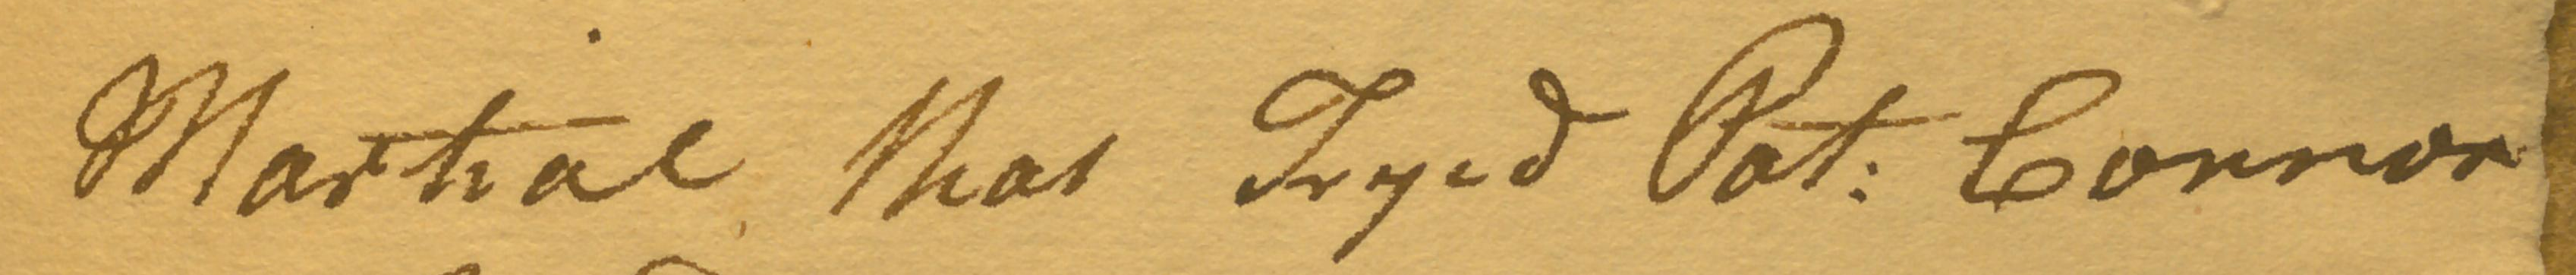Martial that Fryed Pat: Connor
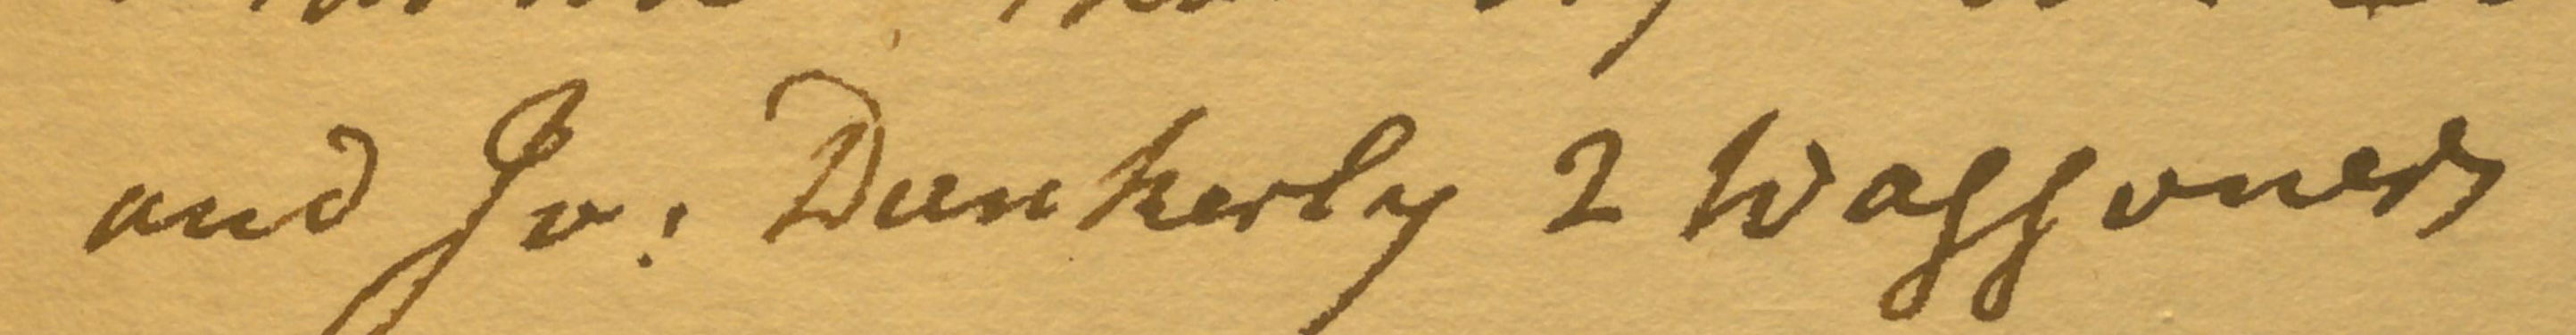and Jo: Dunkerly 2 waggoners
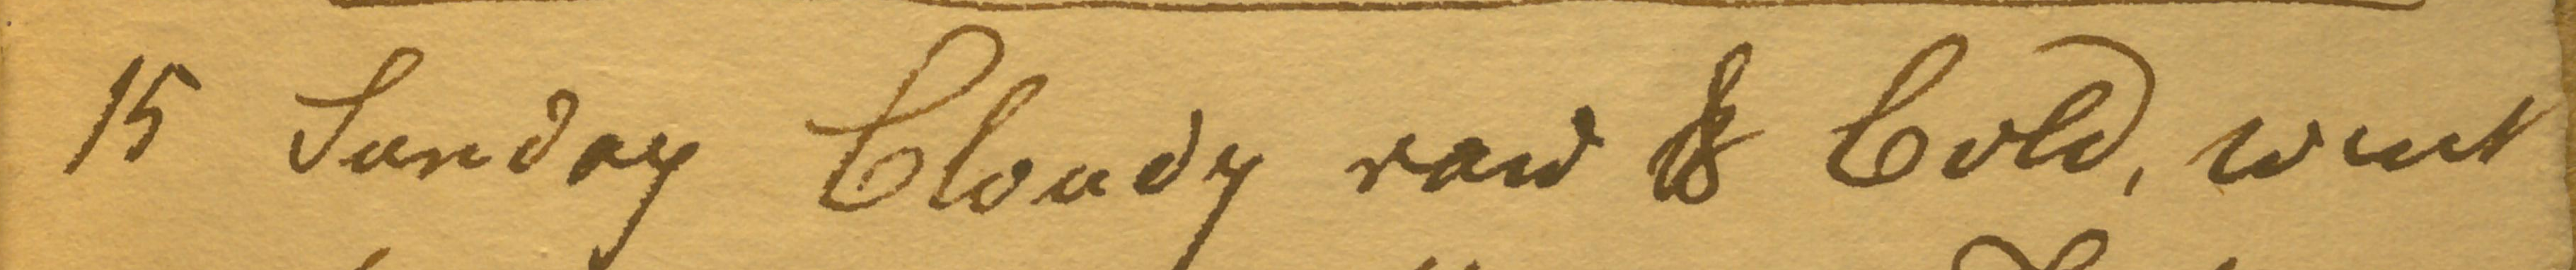15 Sunday Cloudy raw & Cold, went
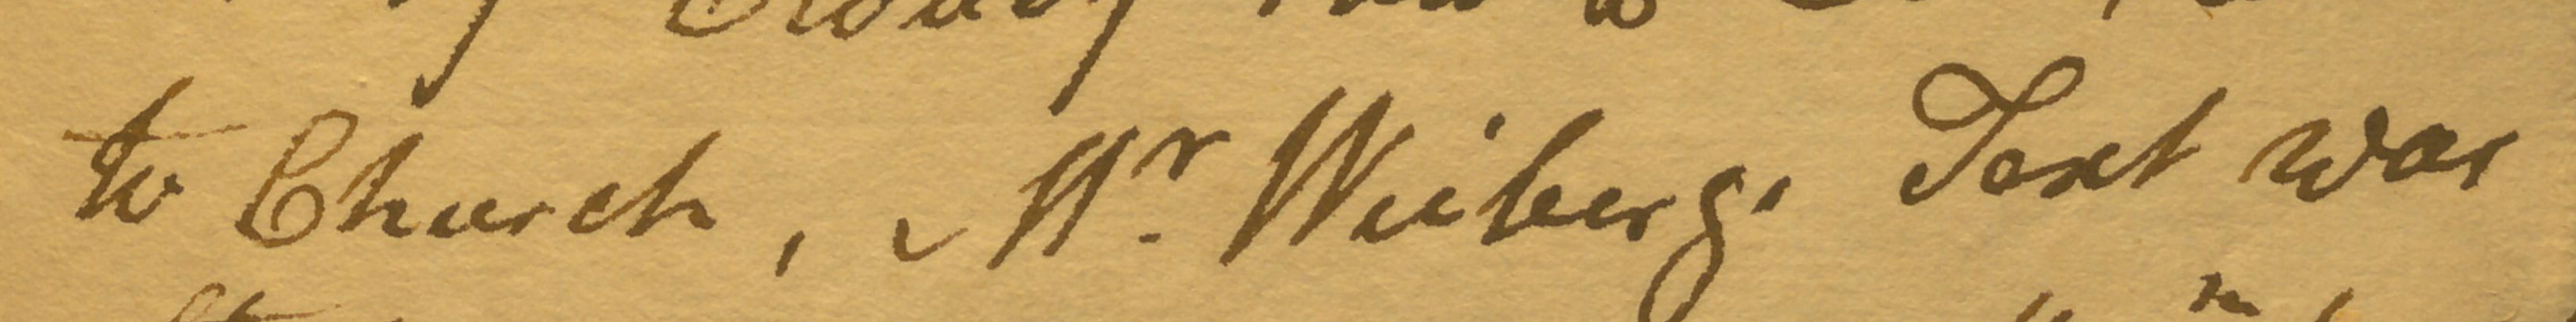to Church, M^r. Weibergs Text was
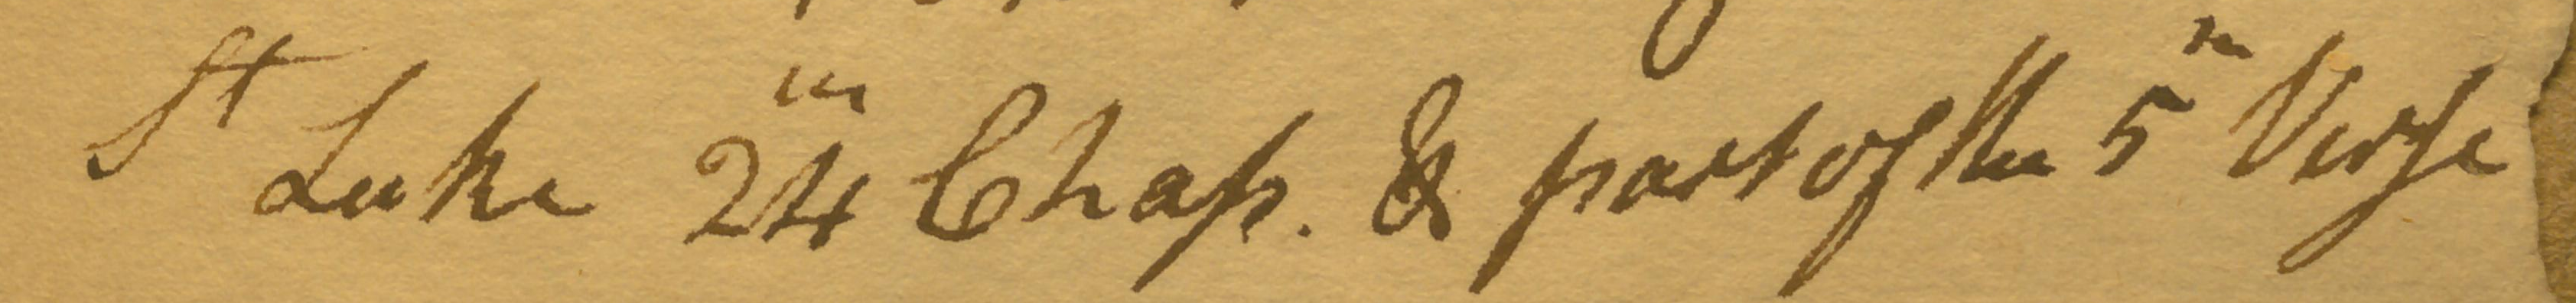S^t Luke 24^th Chap. & part of the 5^th Verse
